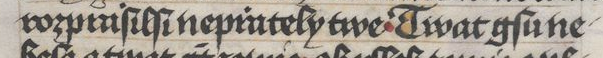rozpraẛilſi nepṙately twe.Twat gſu ne¬
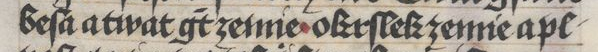beſa a twat ḡt zemie.okrſlek zemie a pl¬
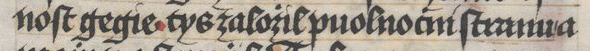noſt gegie.tys zalożil puolnoċni ſtranu.a
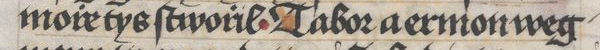moṙe tys ſtwoṙil.Tabor a ermon weg¬
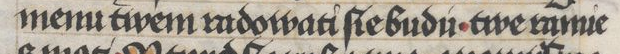menu twem radowati ſie budú.twe ramie
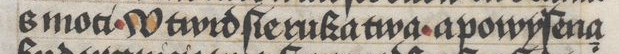s moci.V twrd ſie ruka twa.a powyẛena
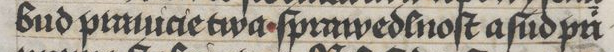bud prauicie twa.ſprawedlnoſt a ſud pṙi¬
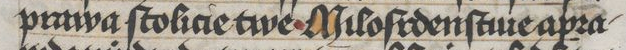prawa ſtolicie twe.Miloſrdenſtuie a pra¬
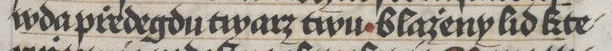wda pṙedegdu twarz twu.blażeny lid kte¬
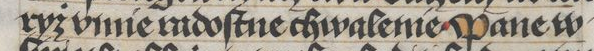ryż vinie radoſtne chwalenie.Pane w¬
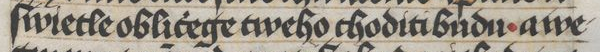ſwietle obliċege tweho choditi budu.a we
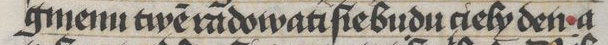gmenu twē radowati ſie budu ciely den.a
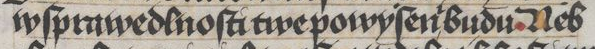wſprawedlnoſti twe powyẛen budu.Neb
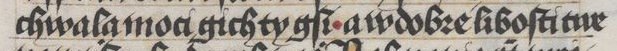chwala moci gich ty gſi.a wdobré liboſti twe
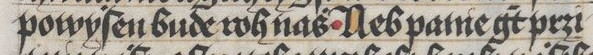powyẛen bude roh naš.Neb panie ḡt przi¬
